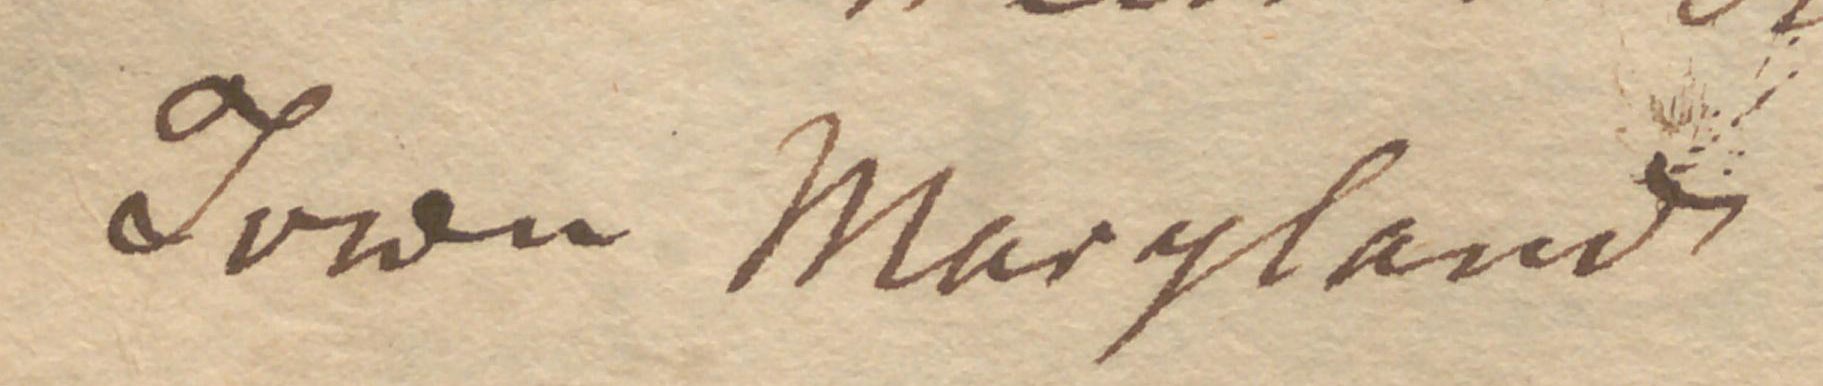Town Marylands
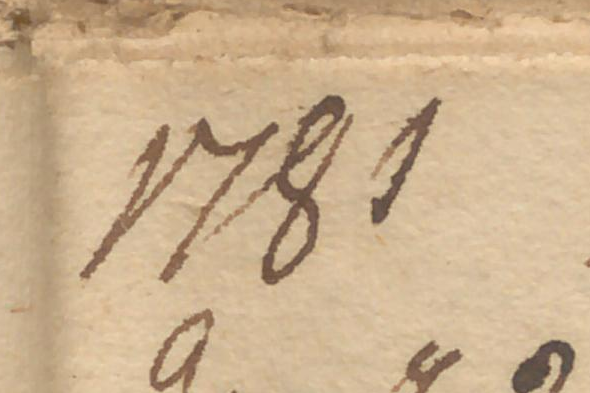1781
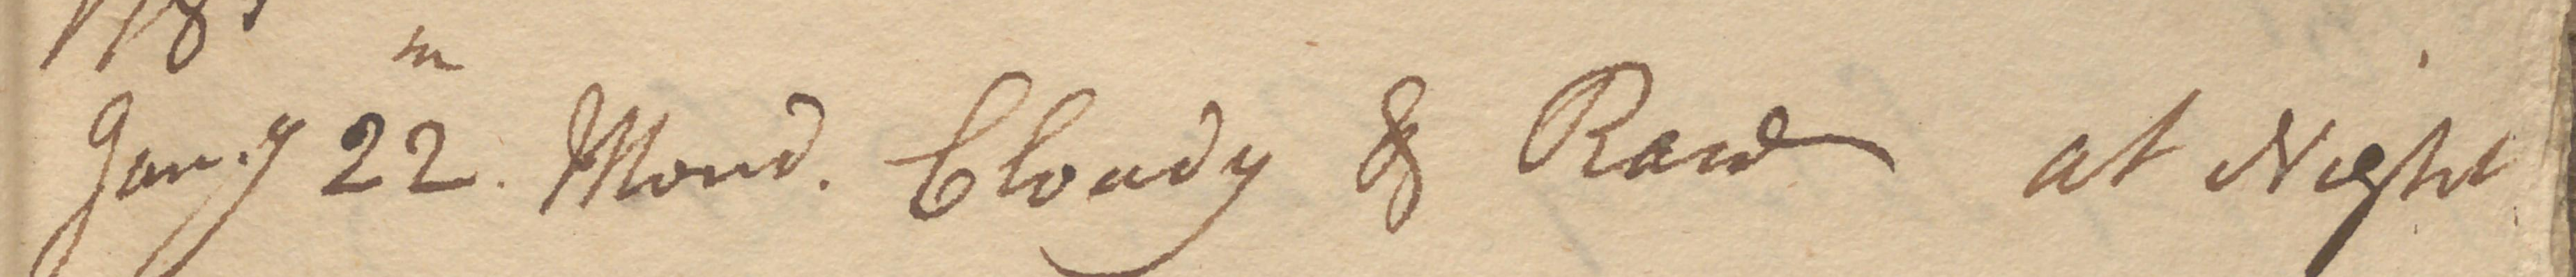Jan^y 22^th. Mond. Cloudy & Raw at Night
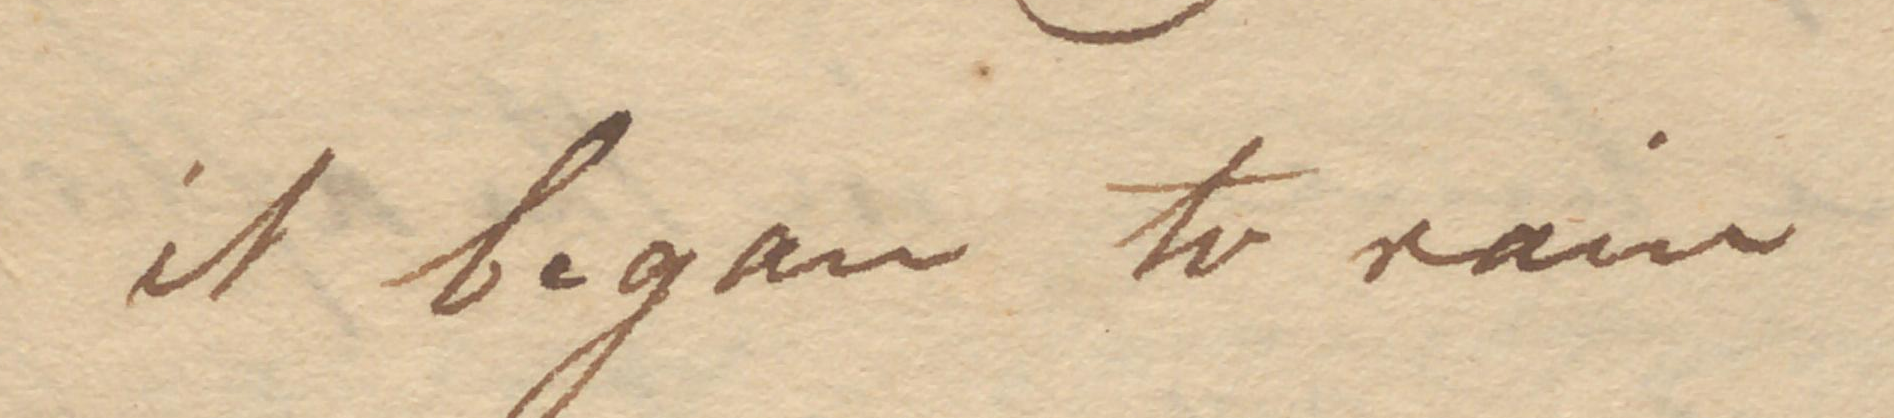it began to rain
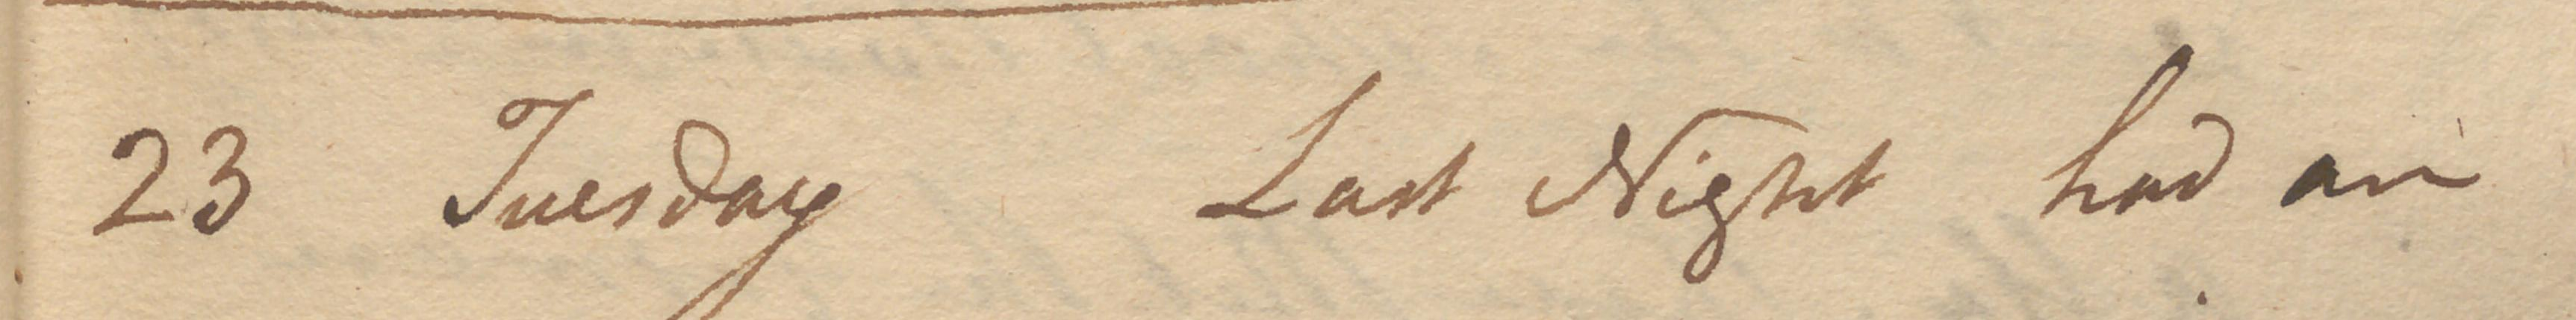23 Tuesday Last Night had an
